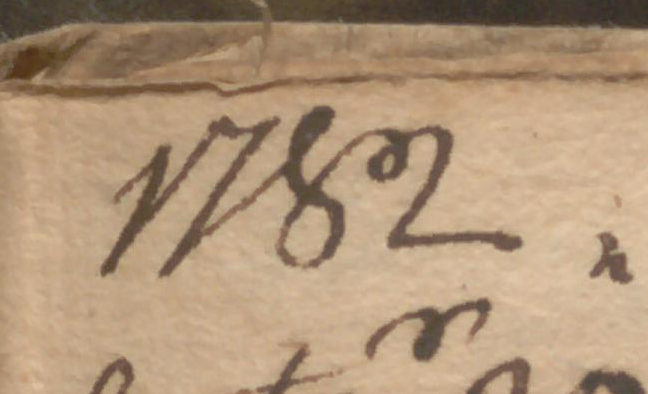1782
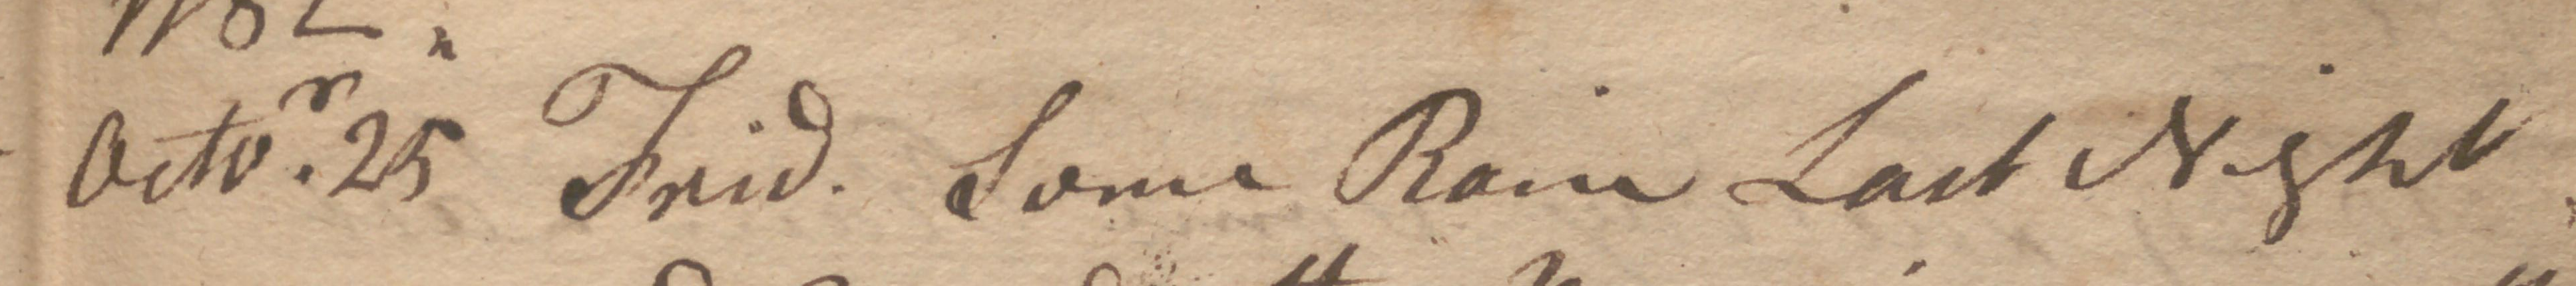Octo^r. 25 Frid. some Rain Last Night
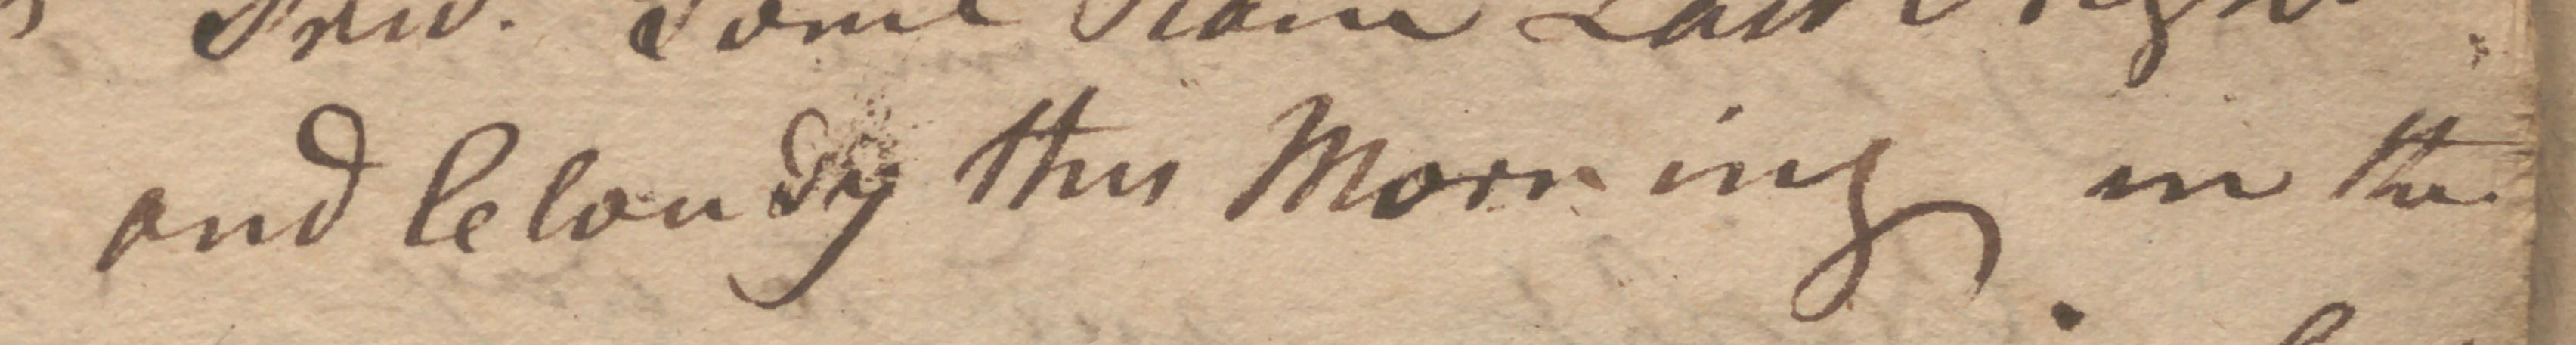and Cloudy this Morning in the
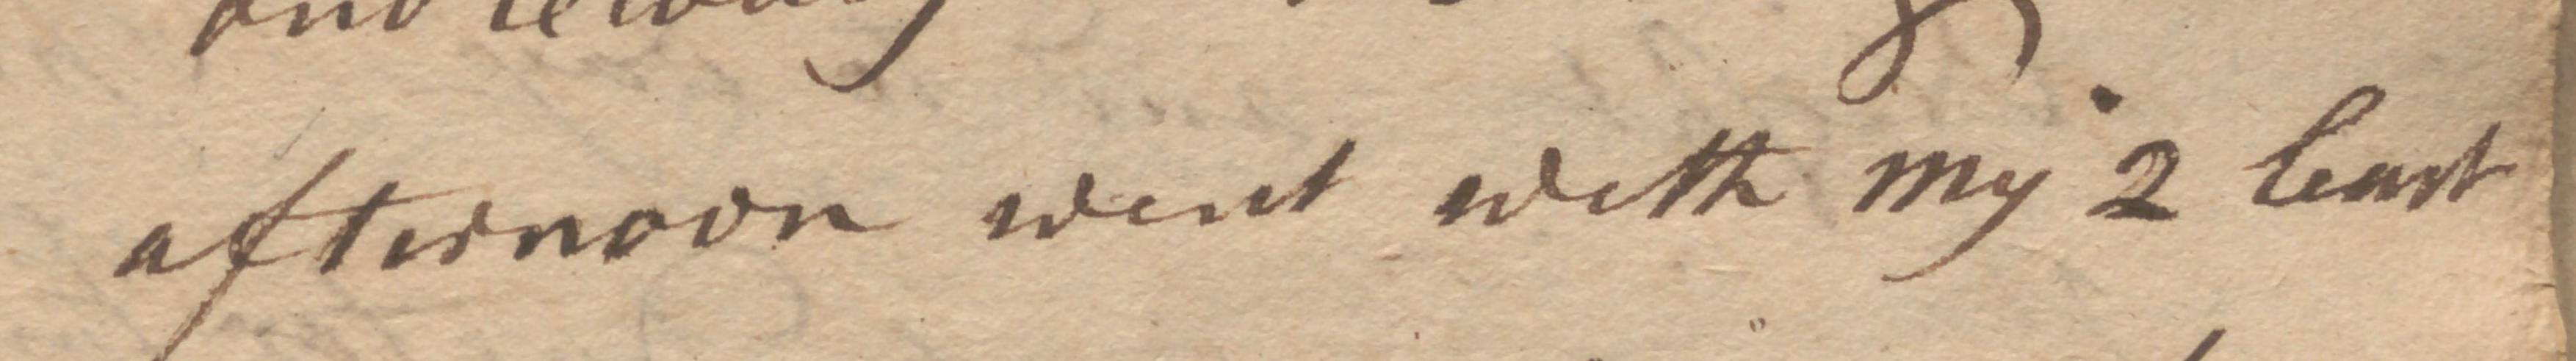afternoon went with My 2 least
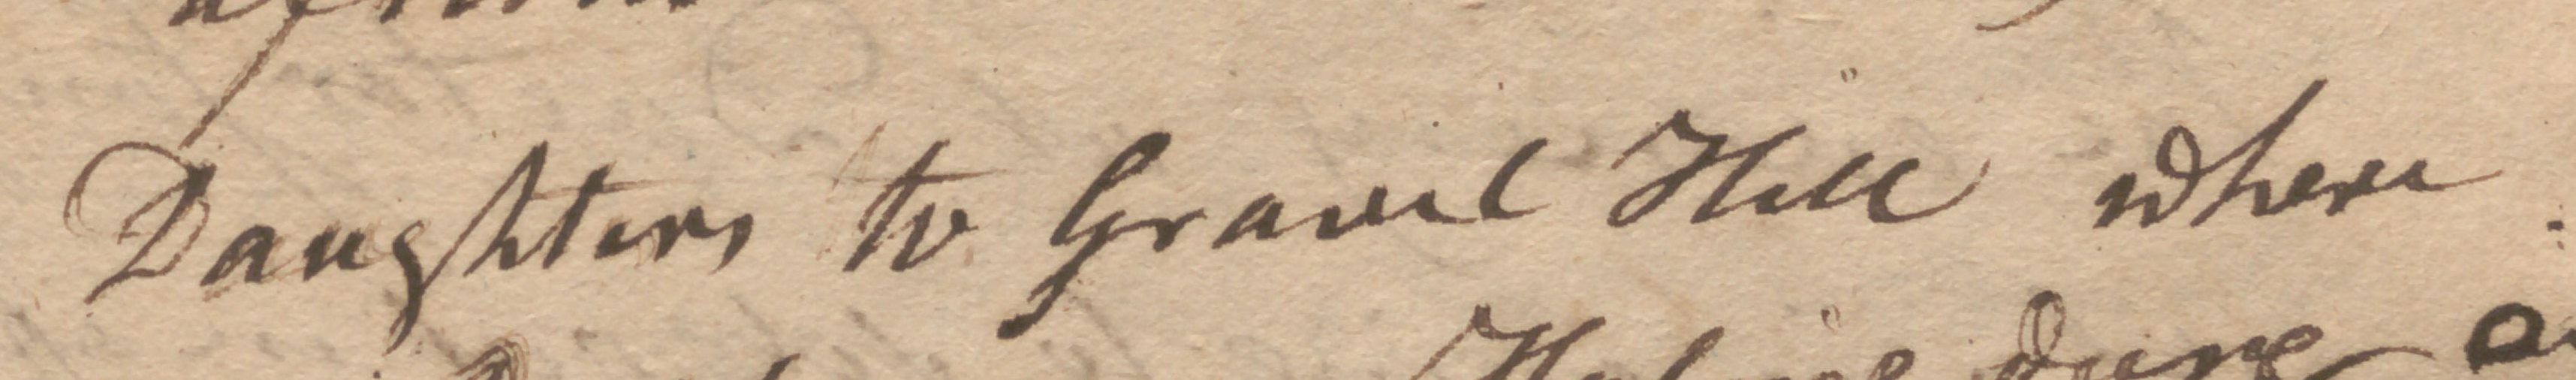Daughters to Gravel Hill where
